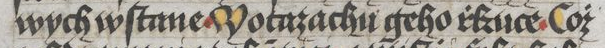wych wſtane.Y otazachu geho ṙkuce. Což¬
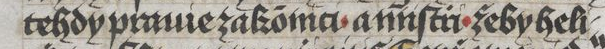tehdy prauie zakōnici a miſtṙi.žeby heli¬
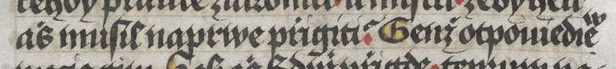aṡ muſil naprwe pṙigiti? Genž otpouidiew
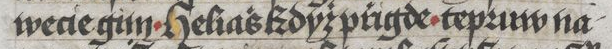wecie gim.Heliaṡ kdyż pṙigde.tepruw na¬
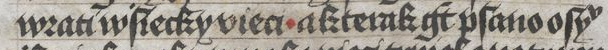wrati wẛiecky vieci.a kterak ḡt pſano o ſyv
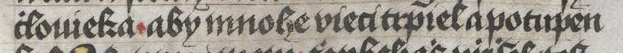ċlouieka.aby mnohe viecí trpiel a potupen
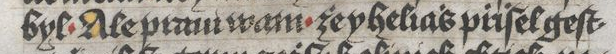byl. Ale praui wam.że y heliaṡ pṙiẛel geſt
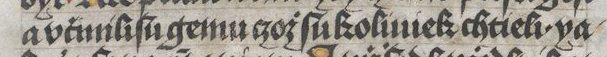a včiniliſu gemu czoż ſu koliuek chtieli.ya¬
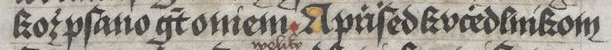koż pſano ḡt oniem. A pṙiẛed kvċedlníkom
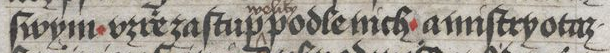ſwym.vzṙe zaſtup weliky podle nich.a miſtry otaz¬
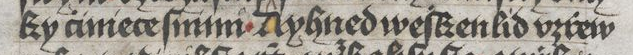ky ċiniece ſnimi. Ayhned weẛken lid vzṙew
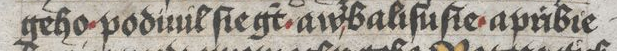geho.podiul ſie ḡt.a wzbali ſu ſie.a pṙibie¬
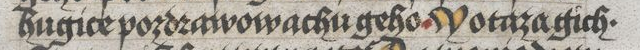hugíce pozdrawodachu geho.Y otaza gich.
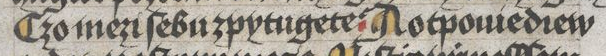Czo mezi ſebu zpytugete?A otpouiediew
